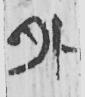外
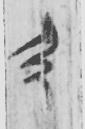弓
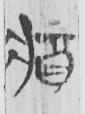𨟻（將）
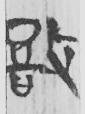{豆口攴}
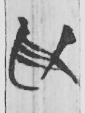爲
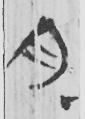肉
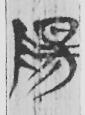陽
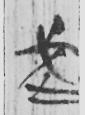武
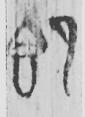即
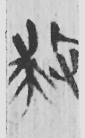救
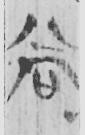尚
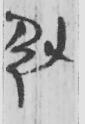引
